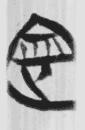{宀丵止}
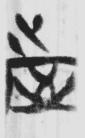{之室}
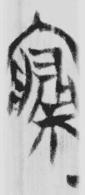寢
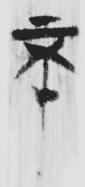不
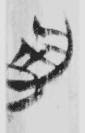勑
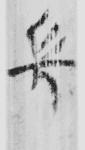𡵂
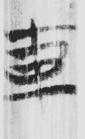車
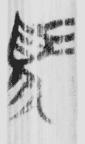馬
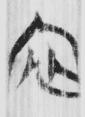衣
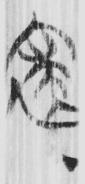裘
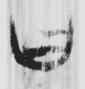曰
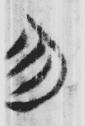勿
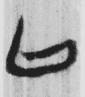㠯（以）
